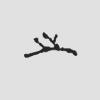之
